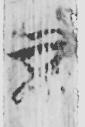不
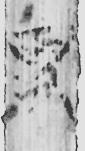𠭁（得）
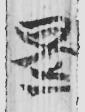是
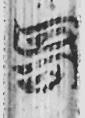{㠯ㅋ}
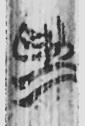爲
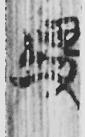埤
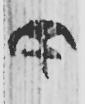丁
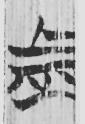者
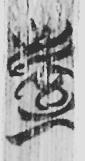{鹿止}
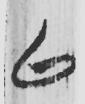㠯（以）
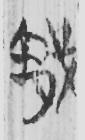{午卩戈}
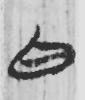白
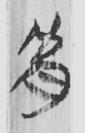兔
